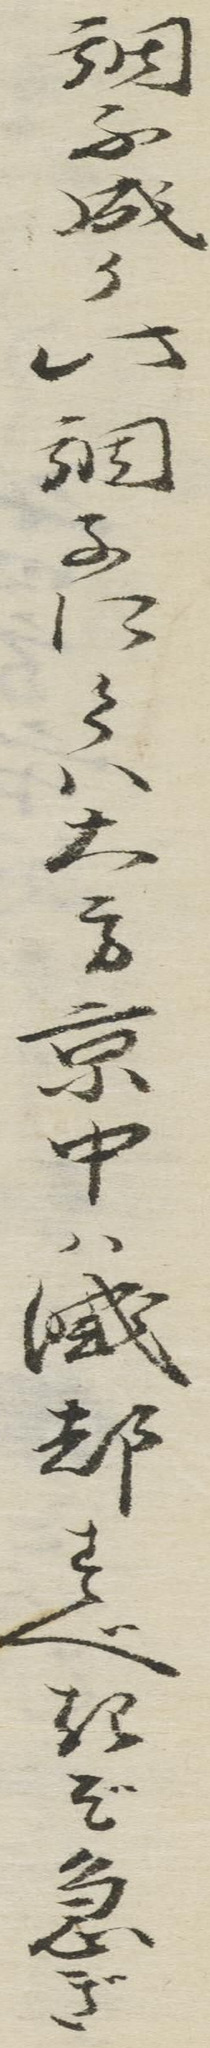調ふ成か此調子にてハ大方京中ハ滅却すべきぞ急ぎ
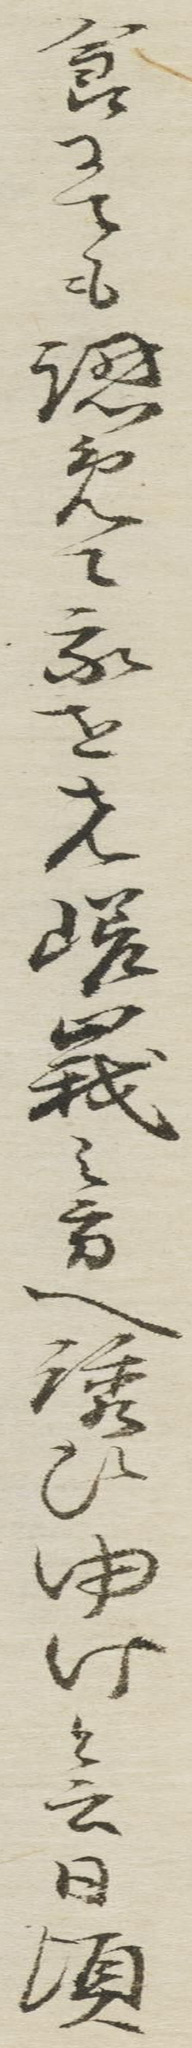食にても認めて我を先嵯峨之方へ誘ひ申計と云日頃
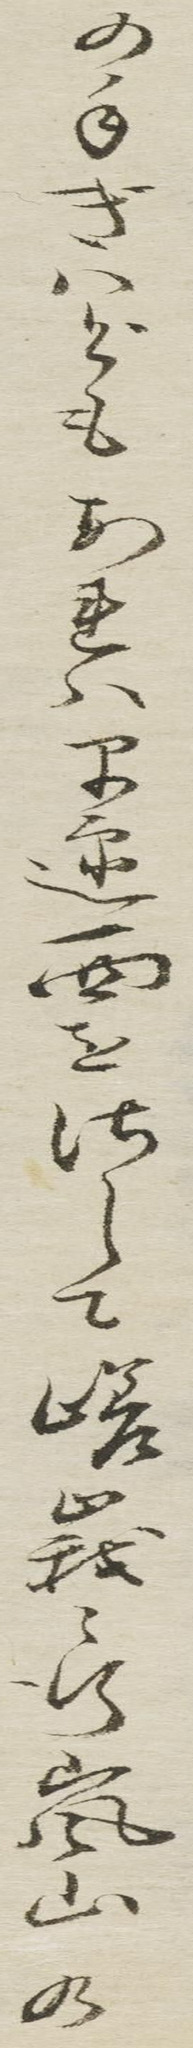の手ぎハどもあれは早速西をさして嵯峨に行嵐山の
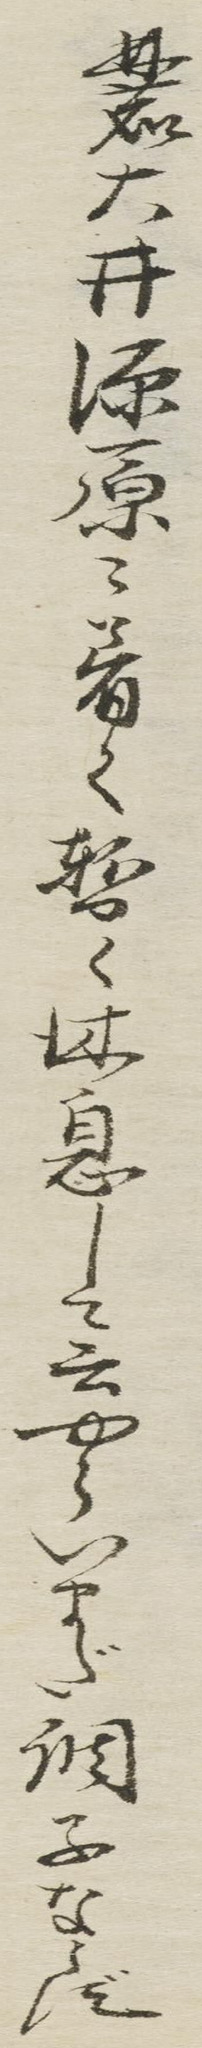麓大井深原ニ着て暫く休息して云やういまだ調子ならず
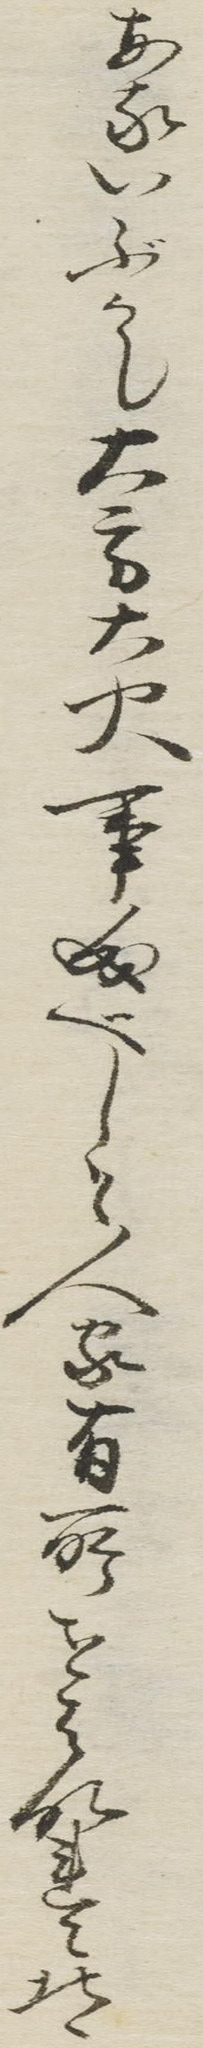あないぶかし大方大火事成るべしと人家有所をはなれて北へ
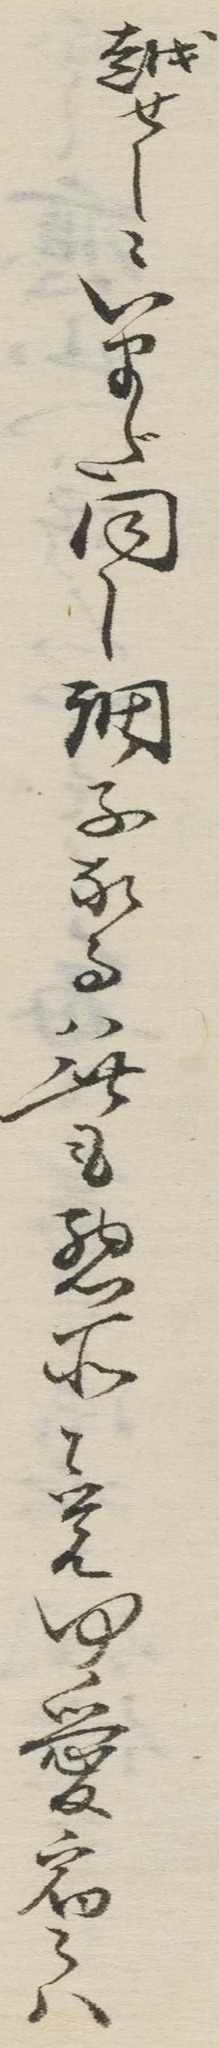越せしいまだ同じ調子なるハ此も悪所と覚ゆ愛宕宿ニハ
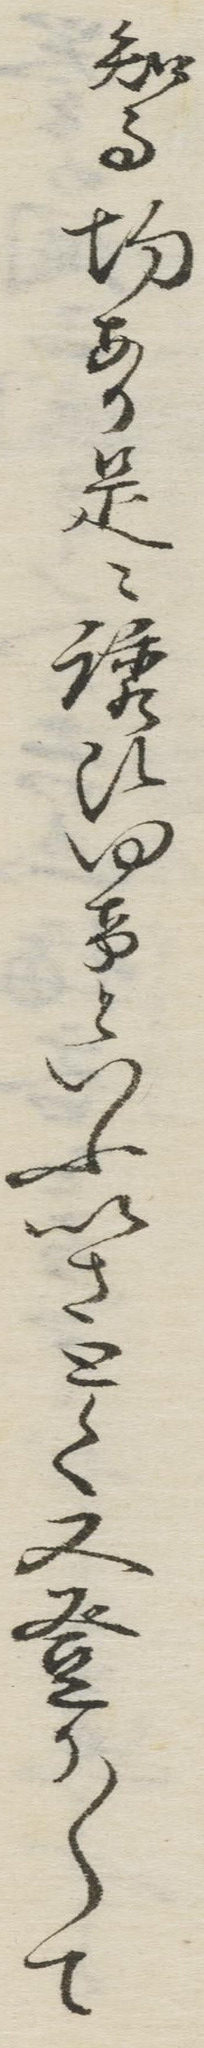知る場あり是ニ誘ひゆけといふいざとく又登いりして
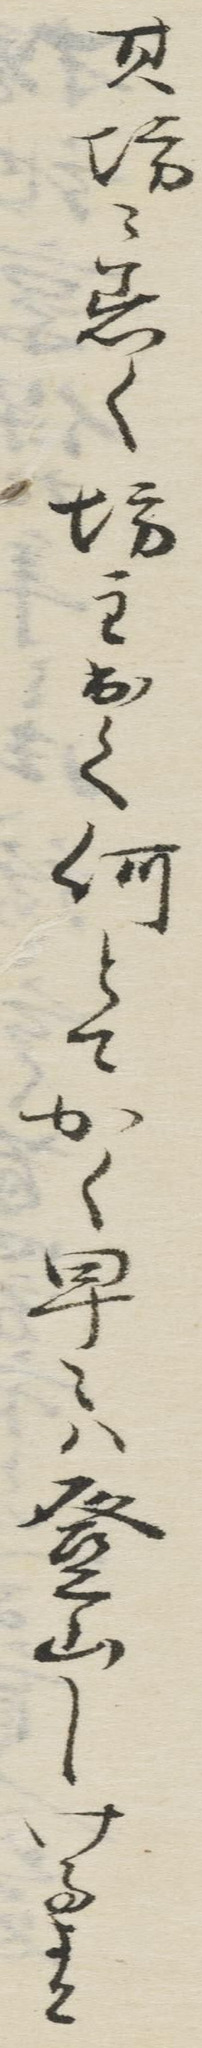其坊ニ着く坊主出て何とてかく早々ハ登山しけるよと
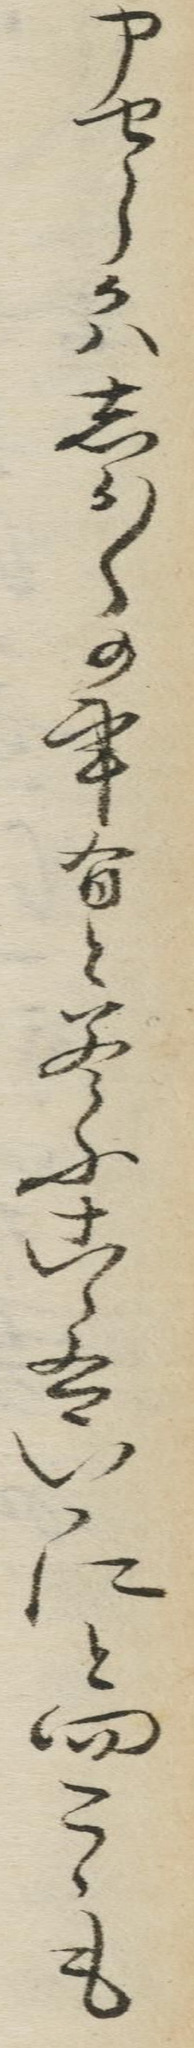申セラハしか〳〵の事有と答ふこゝはいかにと向うも
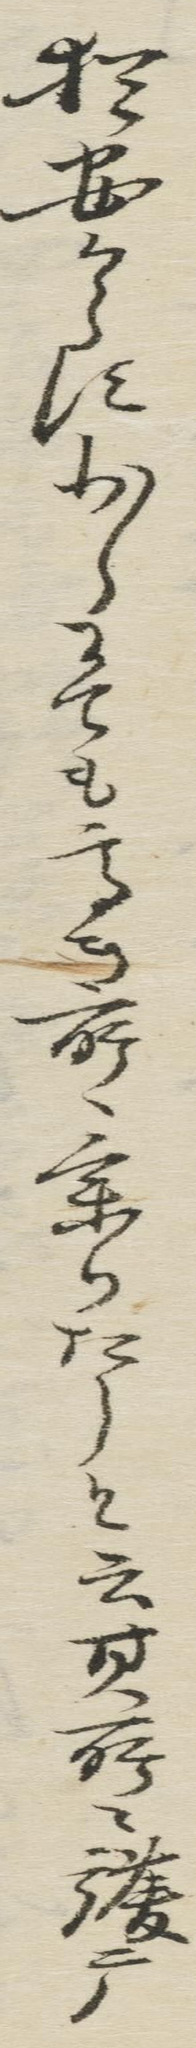猶安からず少しにても高き所へ参りたしと云其所ニ護摩
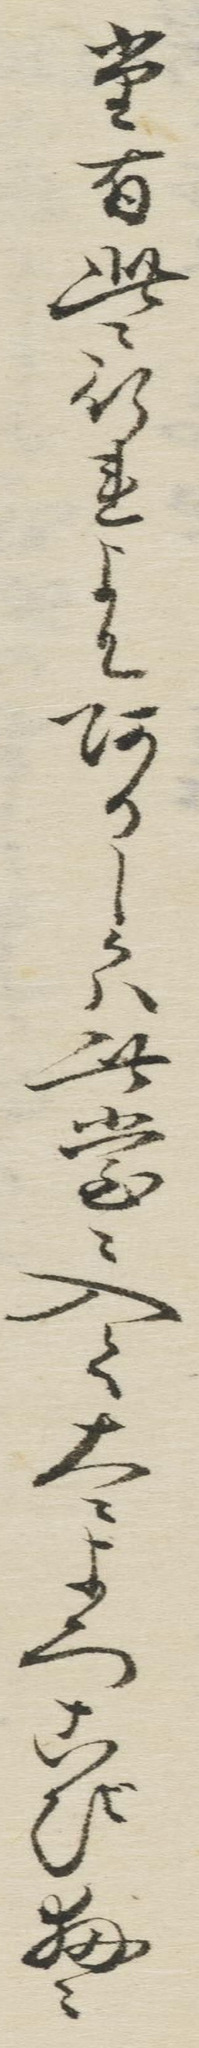堂有此ニ行れよくありしかハ此堂ニ入て大ニよろこび扨々
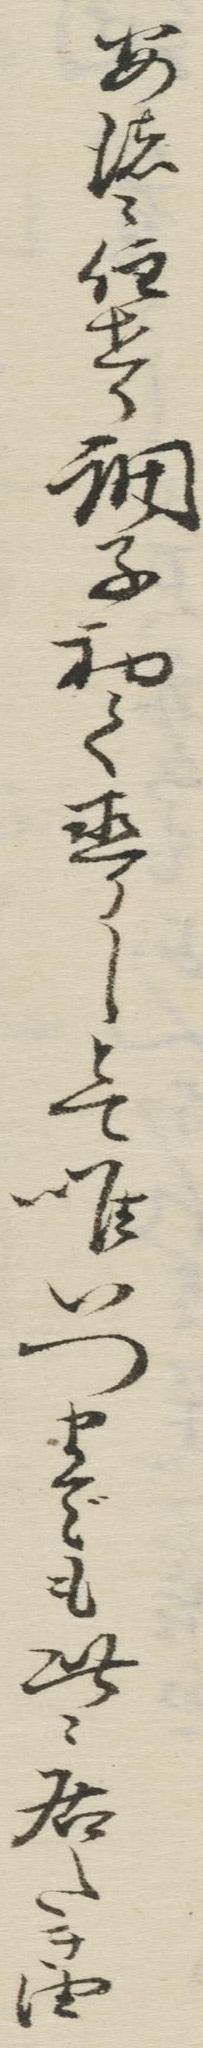安堵ニ住をり調子初て直り候とて唯いつまでも此ニ居たき由
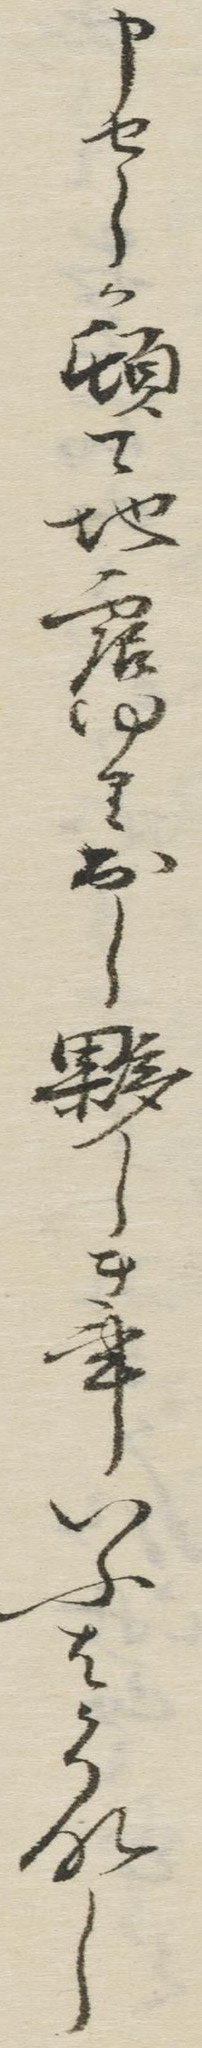申セしが頓て地震ゆり出し夥しき事いふばかりなし
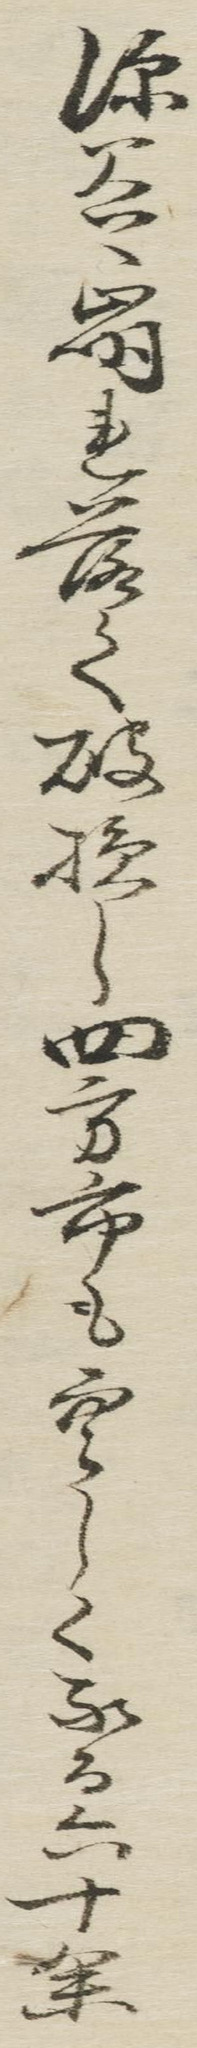深谷ヘ崩れ落て破損し四方市も空しくなる六十余
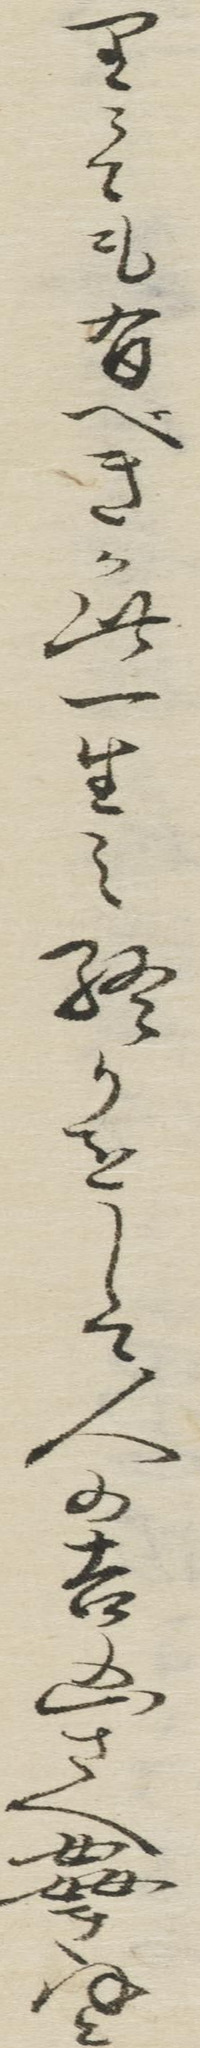里ニても有べきか此一生之終りをして人の吉凶さへ姦きゆゝ
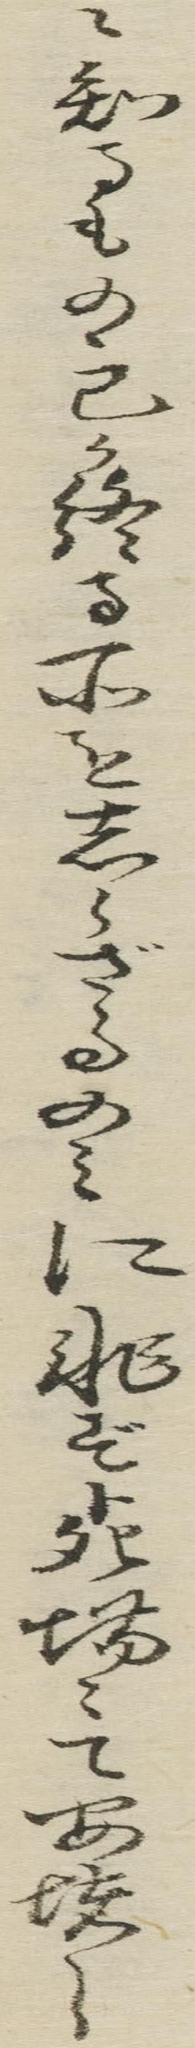ニ知るものゝ己が終る所をしらざるのミに非ずト死場ニて安堵し
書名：諸国大地震大津波一代記
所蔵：東京大学地震研究所図書室 Earthquake Research Institute Library, The University of Tokyo, JAPAN
